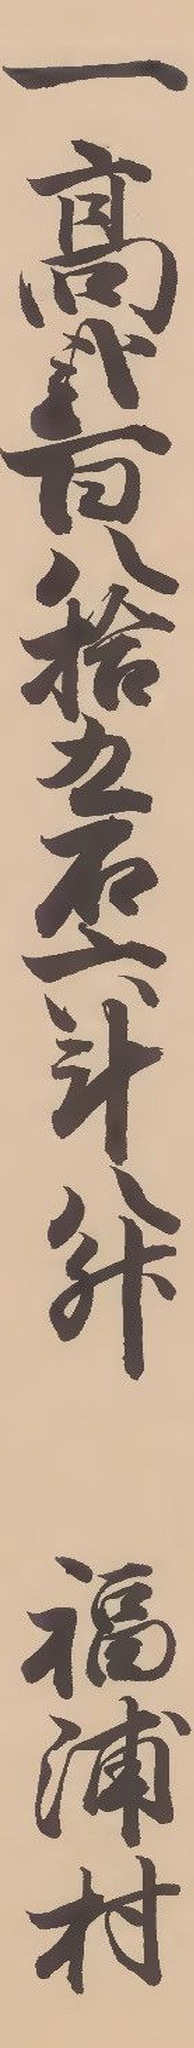一高弐百八拾九石六斗八升福浦村
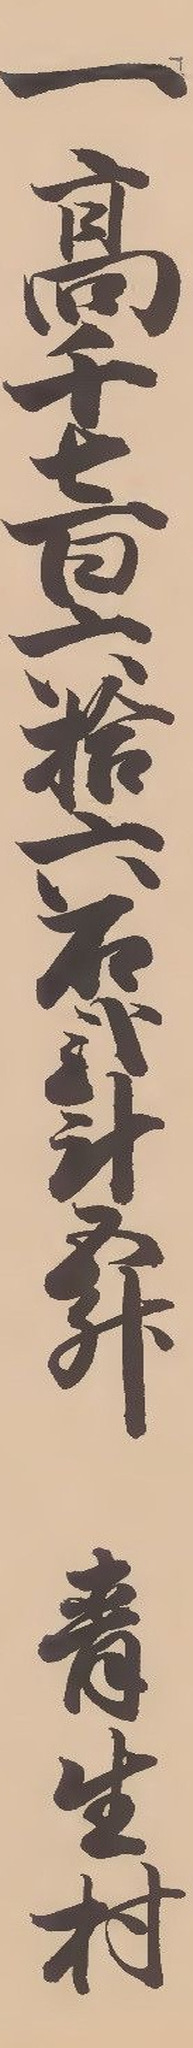一高千七百六拾六石弐斗五升青生村
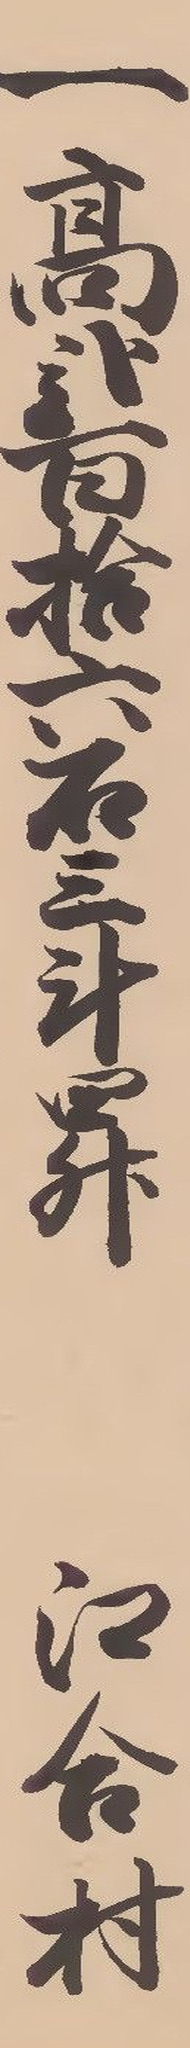一高弐百拾六石三斗四升江合村
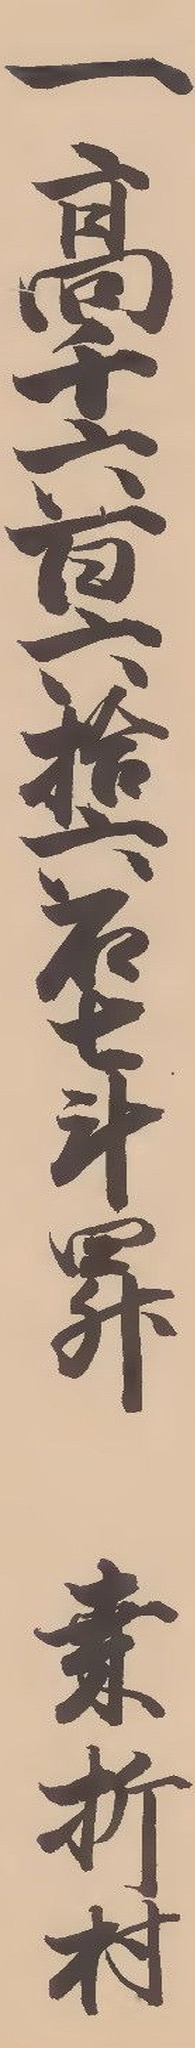一高千六百六拾六石七斗四升桑折村
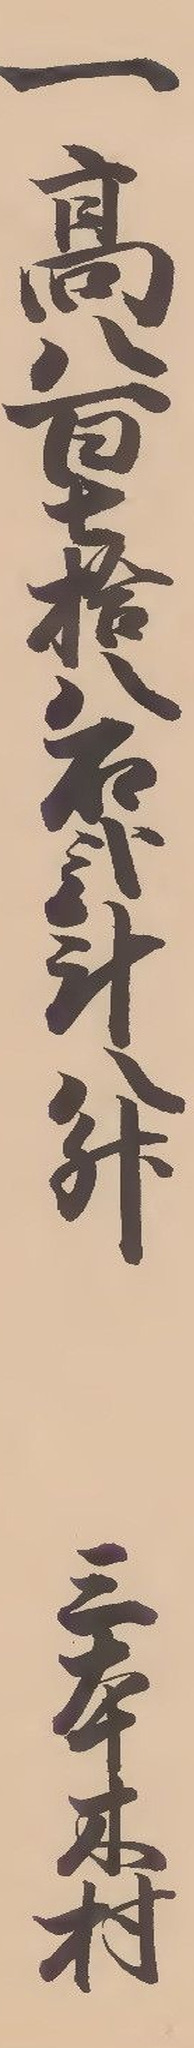一高八百七拾八石弐斗八升三本木村

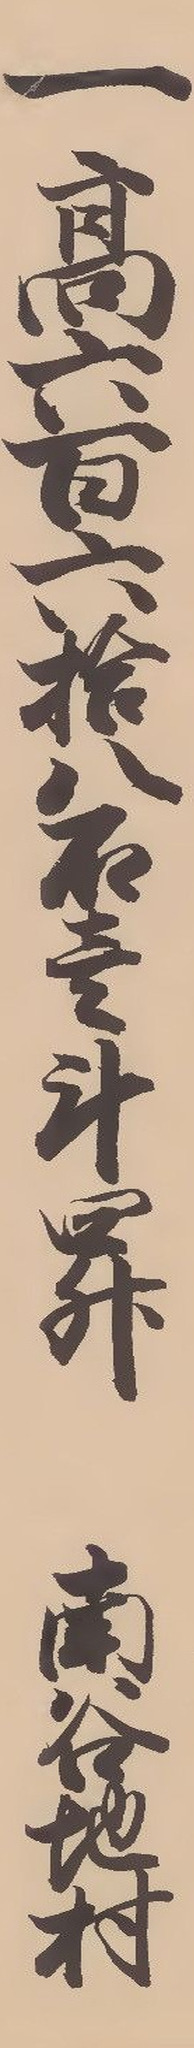一高六百六拾八石壱斗四升南谷地村
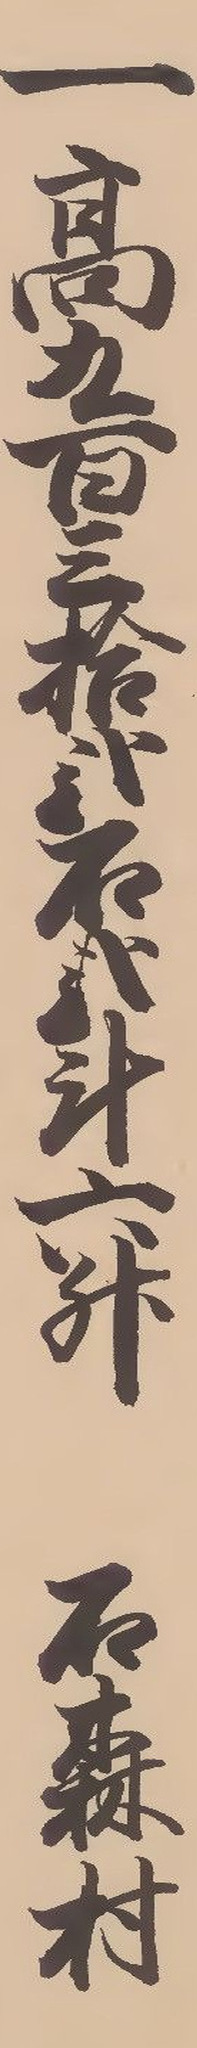一高九百三拾弐石弐斗六升石森村
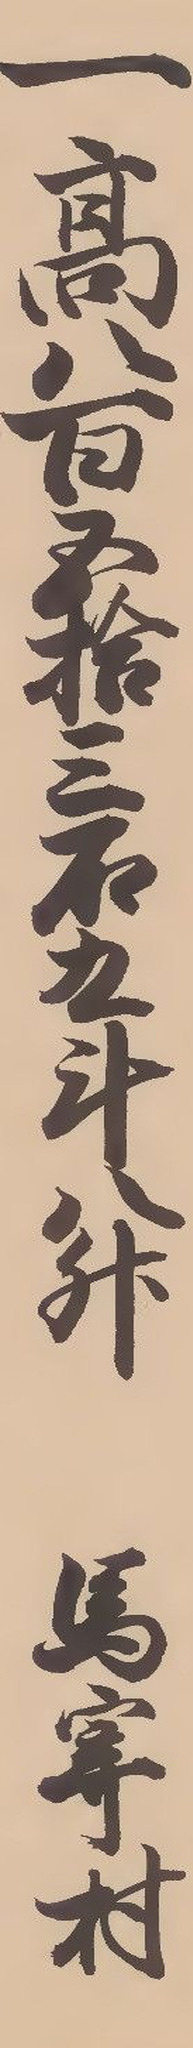一高八百五拾三石九斗八升馬寄村
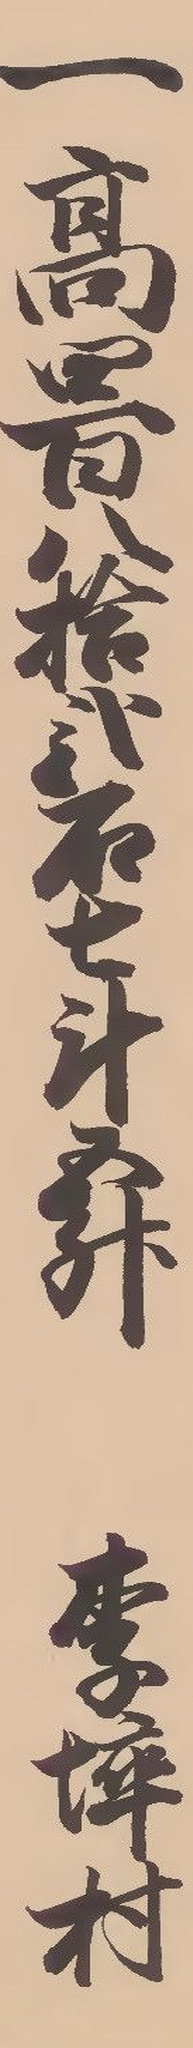一高四百八拾弐石七斗五升李埣村
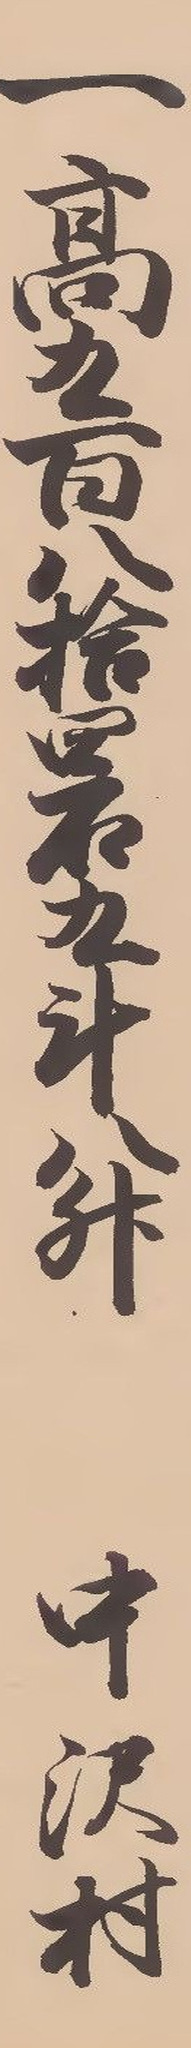一高九百八拾四石九斗八升中沢村
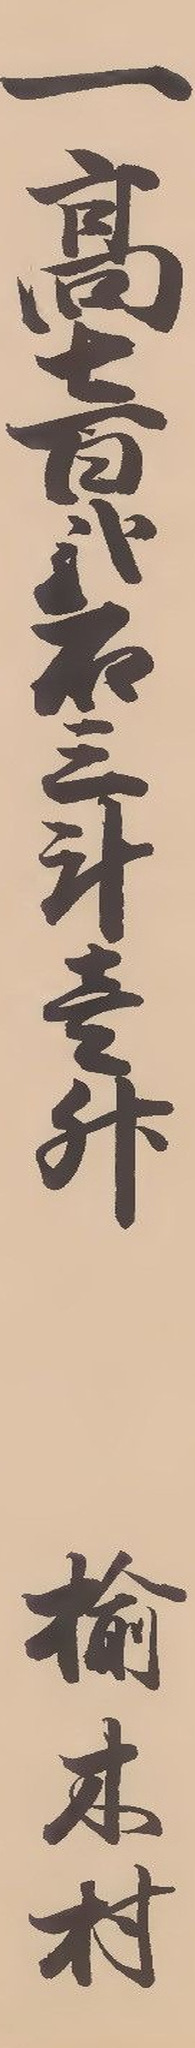一高七百弐石三斗壱升楡木村
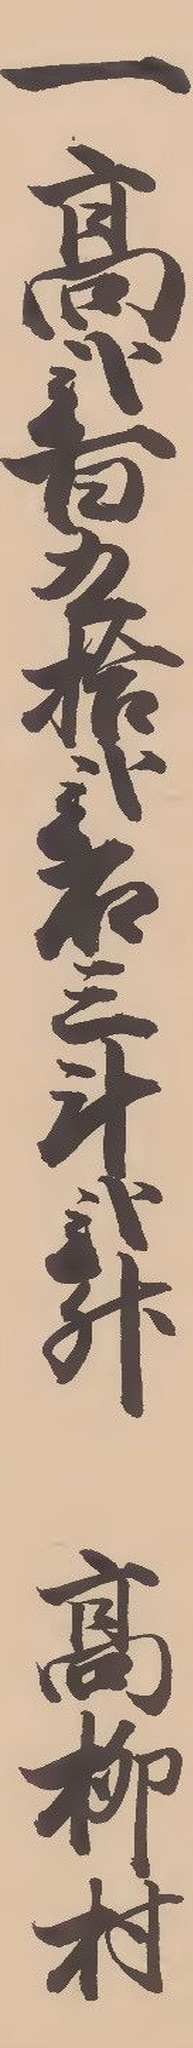一高弐百九拾弐石三斗弐升高柳村
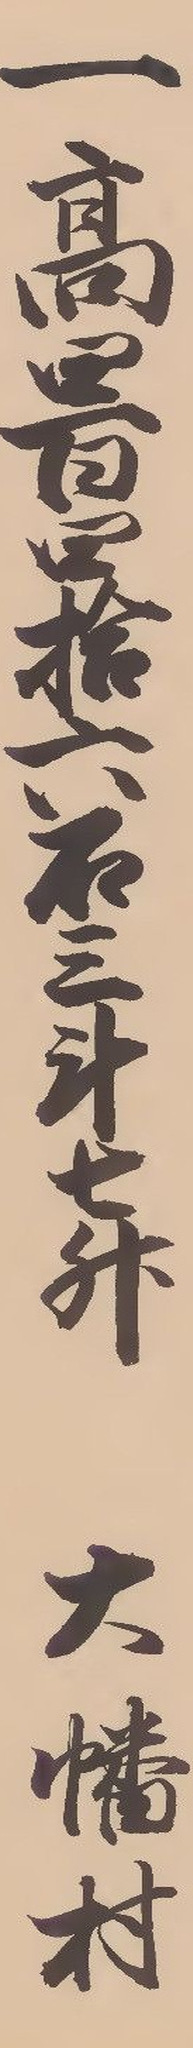一高四百四拾六石三斗七升大幡村

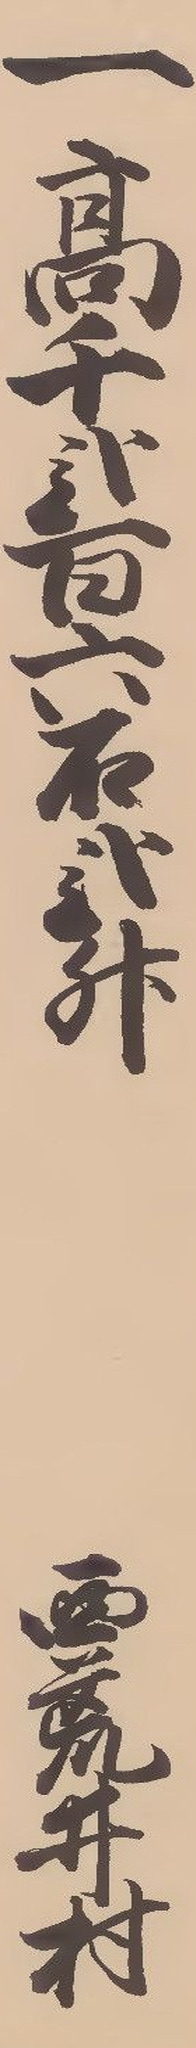一高千弐百六石弐升西荒井村
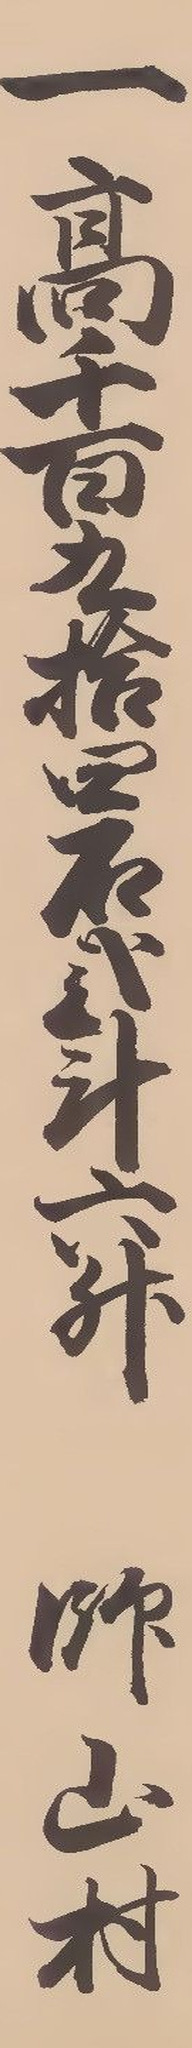一高千百九拾四石弐斗六升師山村
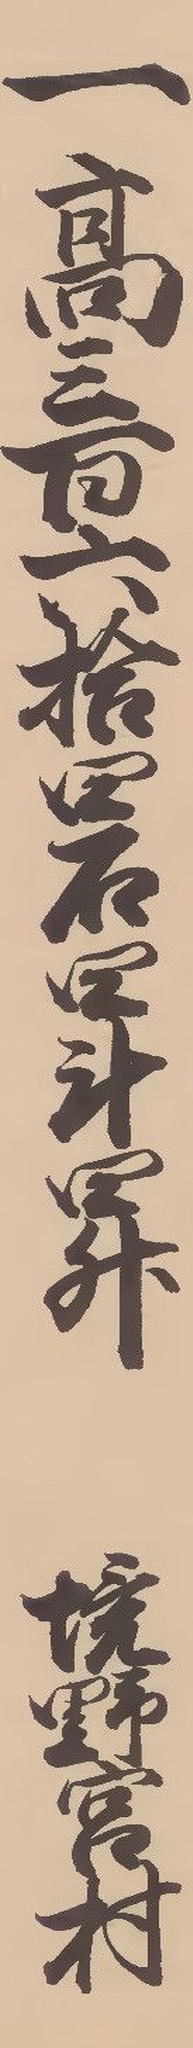一高三百六拾四石四斗四升境野宮村
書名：陸奥国郷帳　５
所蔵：国立公文書館 National Archives of Japan
